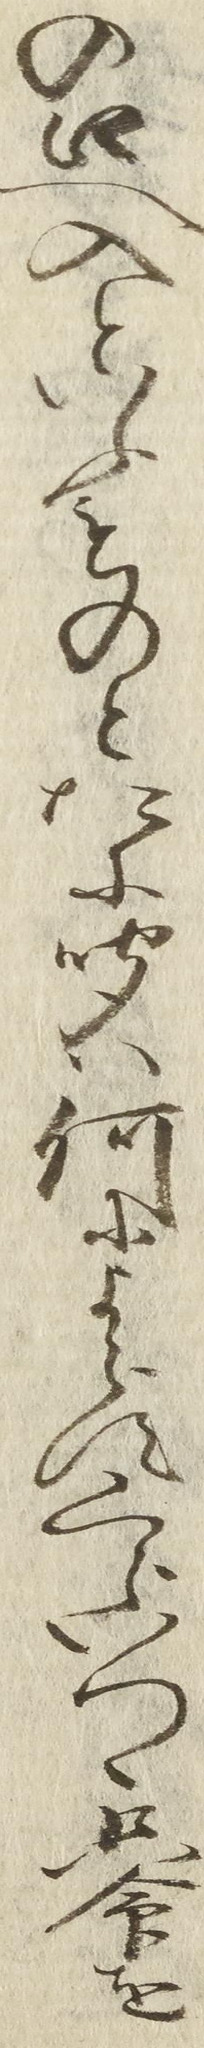の口へ入といふものとたに聞は何によらすくらいつゝ只命を
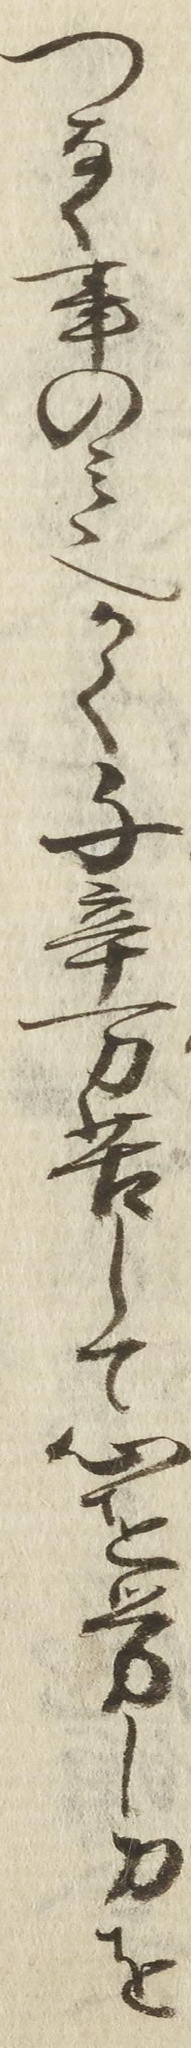つなく事のみ也かく千辛万苦して心を労し力を
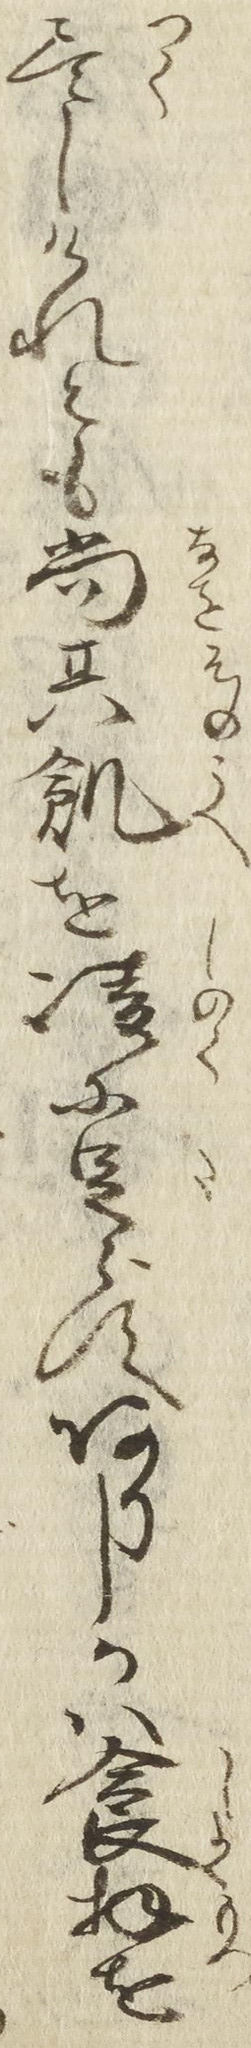尽しけれとも尚其飢を凌に足らすありしかは食物を
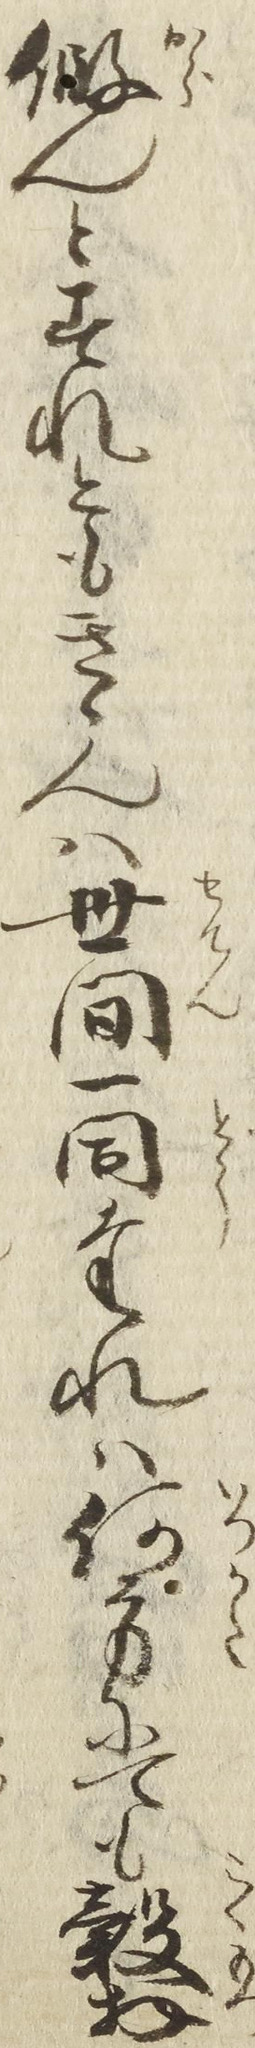假んとすれともきゝんは世間一同たれは何方にても穀物
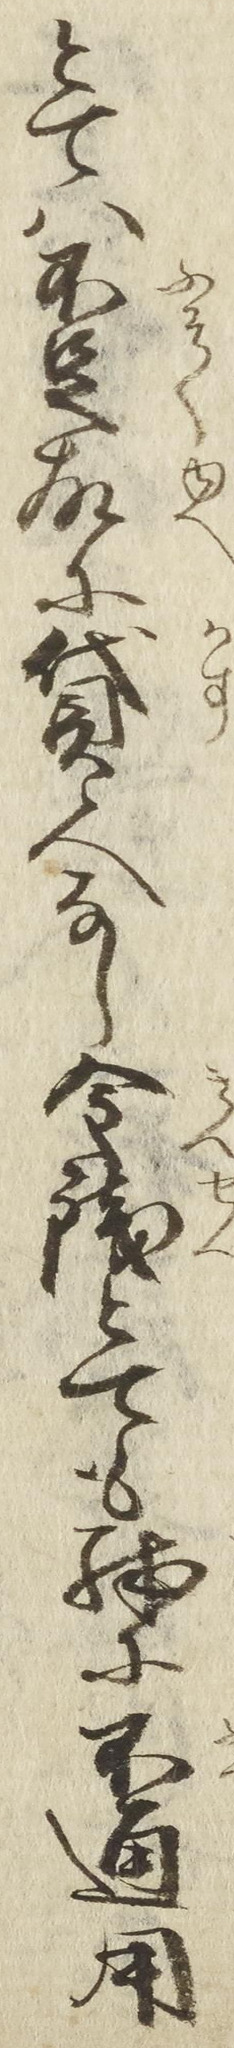とては不足故に貸人なし金銭とても殊に不通用

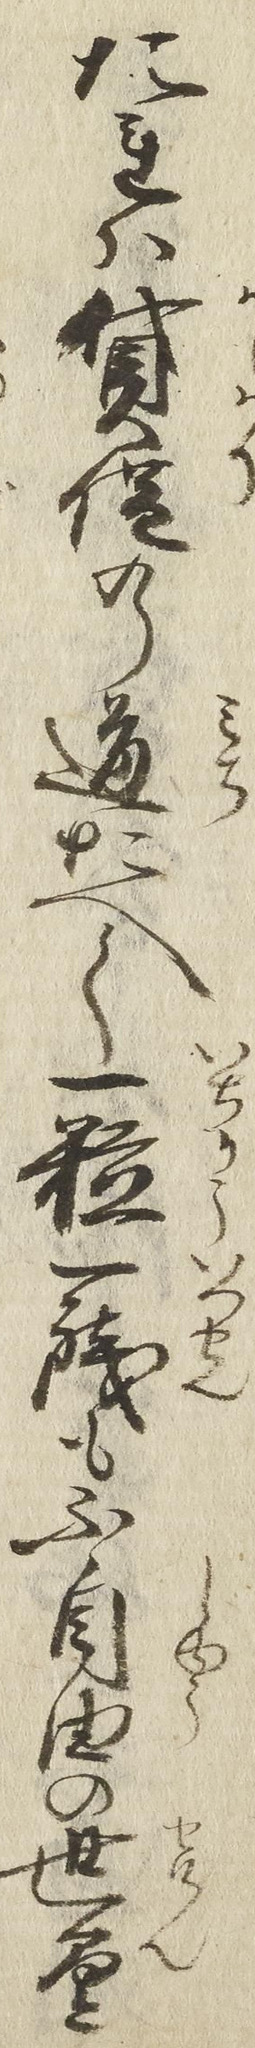たれは貸借の道たへて一粒一銭も不自由の世間と
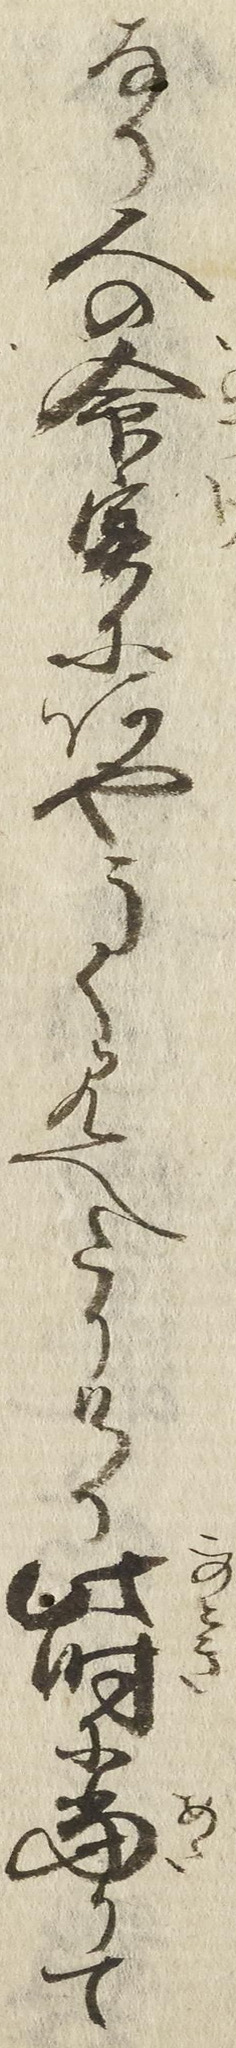なり人の命実にあやうく見へたりけり此時に当りて
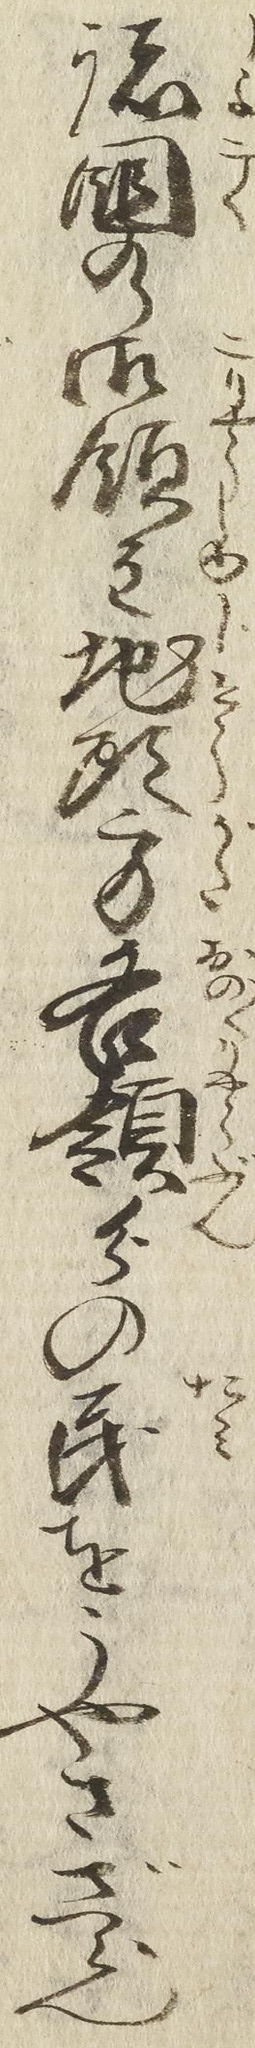諸国の御領主地頭方各領分の民をうやさざらん
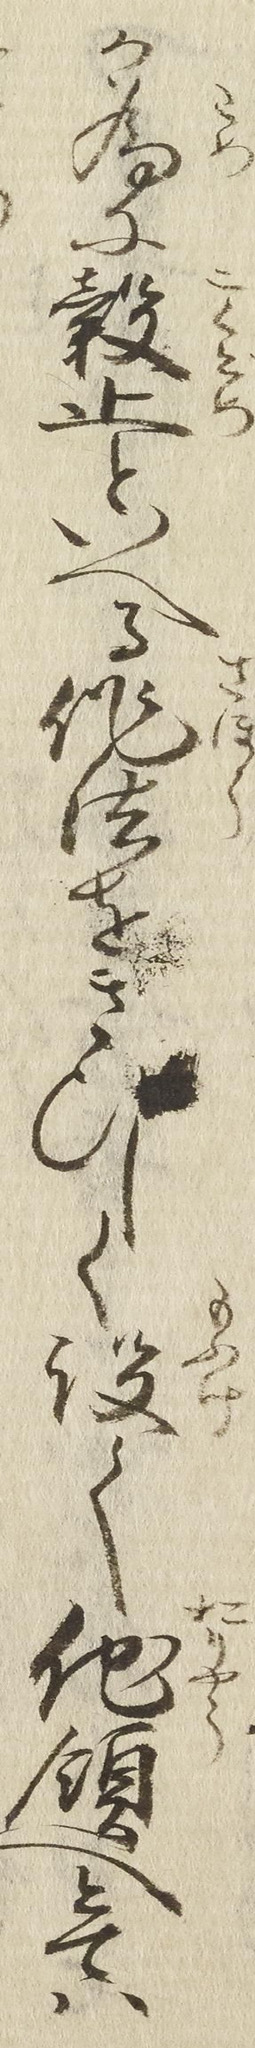か為に穀止といへる作法をきひしく設て他領へとては
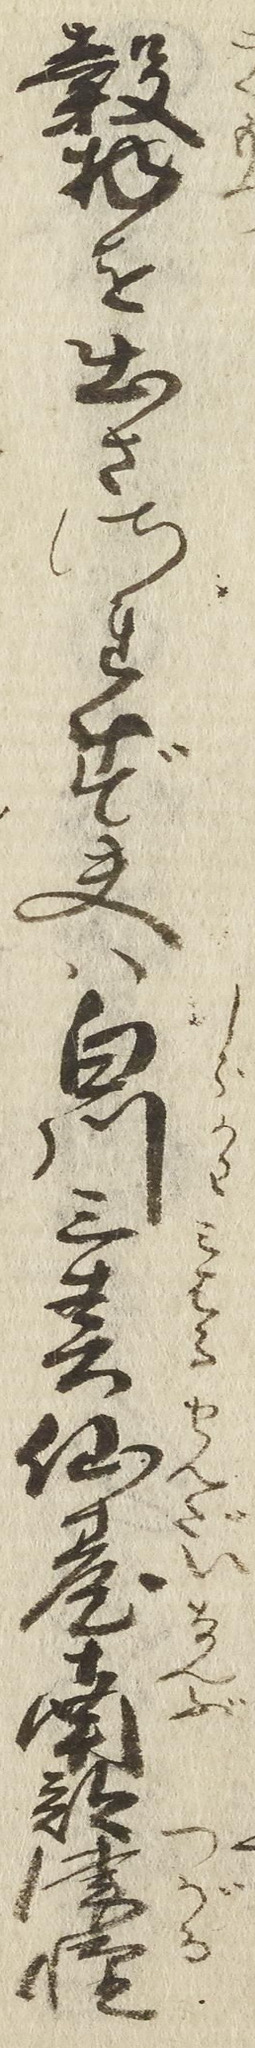穀物を出さされず夫は白川三春仙臺南部津軽
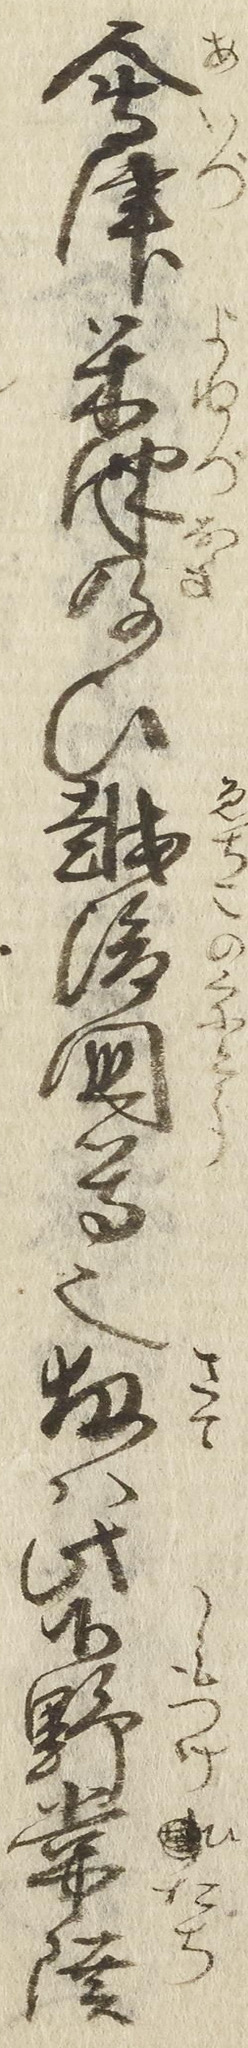會津米津及ひ越後国等也扨は此下野常陸
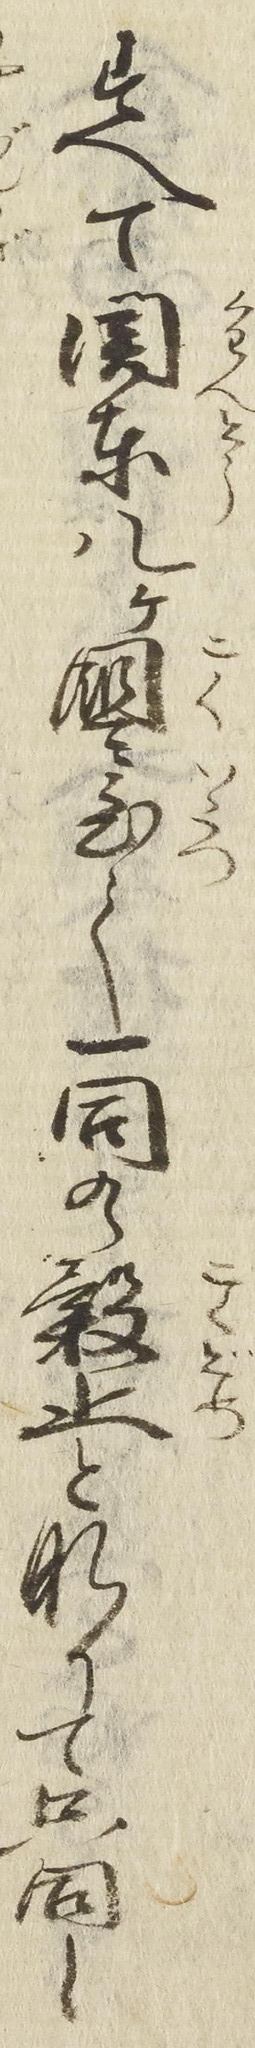すへて関東八ケ国ニ至て一同の穀止となりて只同し
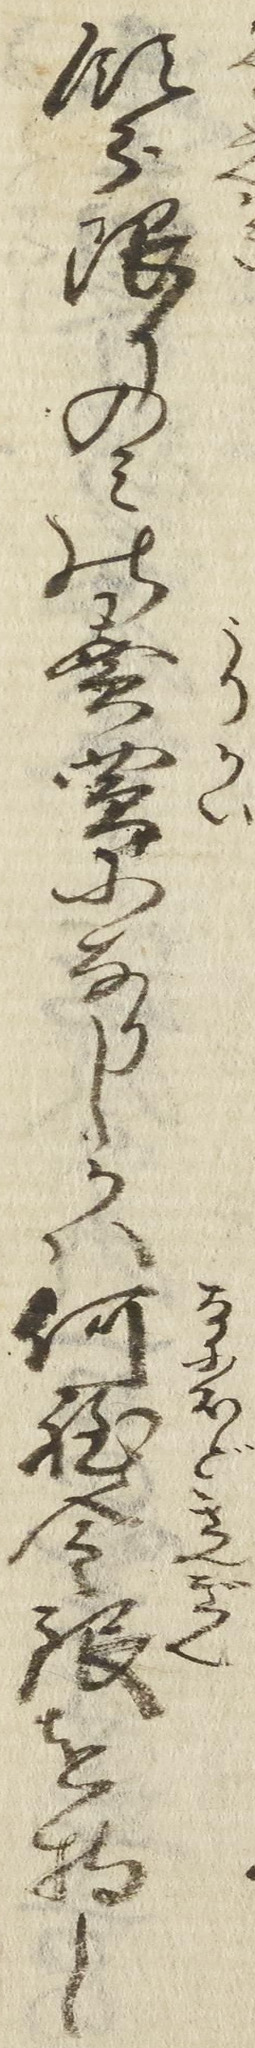領分限りのみの売買になりしかは何程金銀を持し
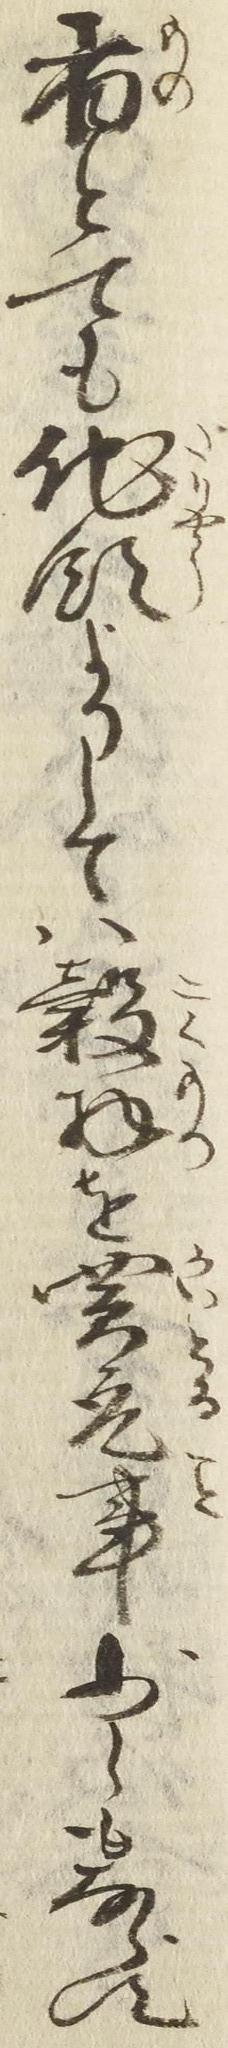者とても他領よりしては穀物を買取事少しもならす
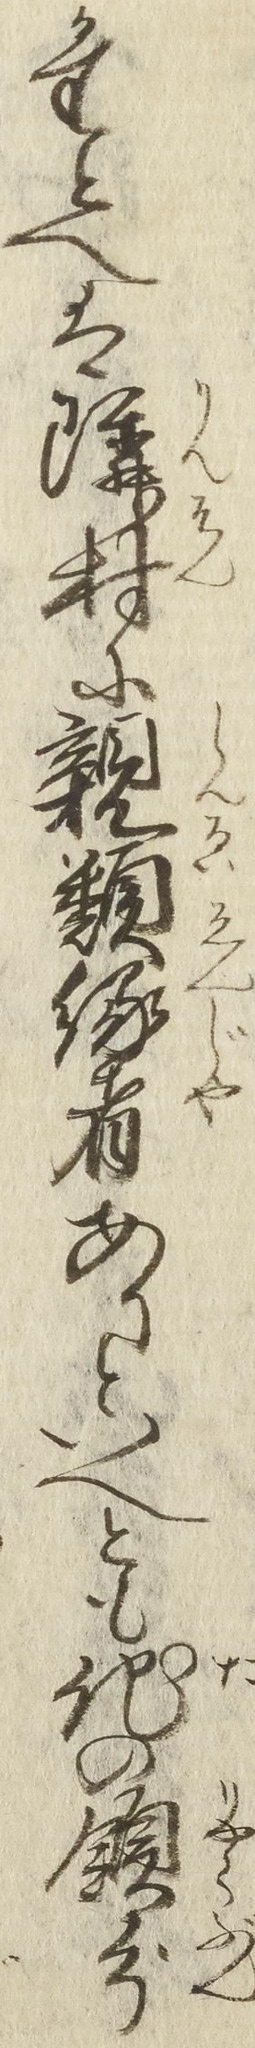たとへは隣村に親類縁者ありといへとも他の領分
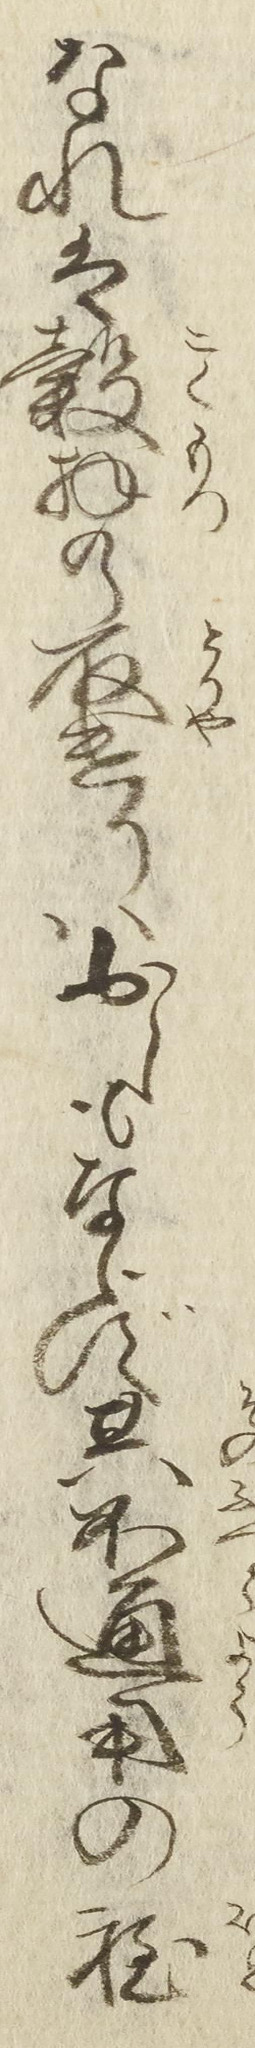なれは穀物の取遣りは少しもならず其不通用の程
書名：天明奇畧　全
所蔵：東京大学地震研究所図書室 Earthquake Research Institute Library, The University of Tokyo, JAPAN
